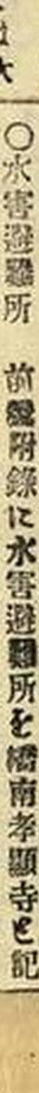○水害避難所前説附録に水害避難所を橋南孝顕寺と記
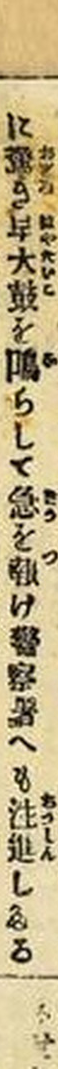に驚き早太鼓を鳴らして急を報け警察署へも注進したる
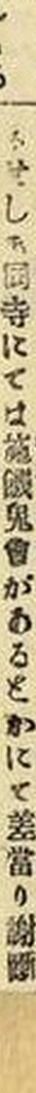るせしを同寺にては施餓鬼會があるとかにて差當り謝斷
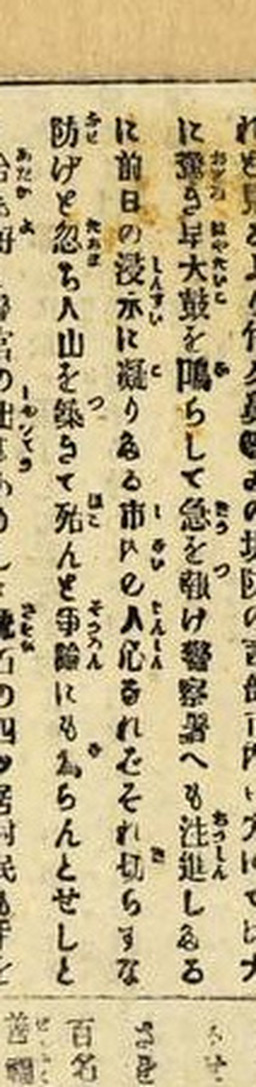に前日の浸水に凝りたる市内の人心なればそれ切らすな
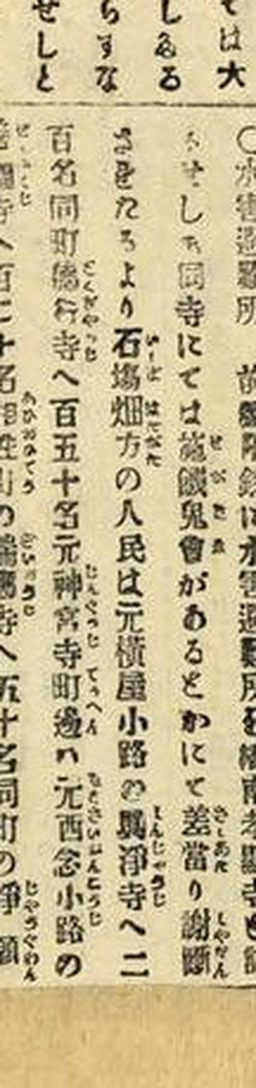されたるより石塲畑方の人民は元横屋小路の眞淨寺へ二
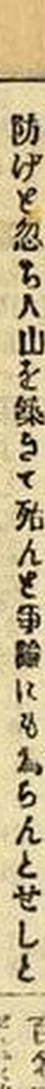防げと忽ち人山を築きて殆んど爭論にも爲らんとせしと
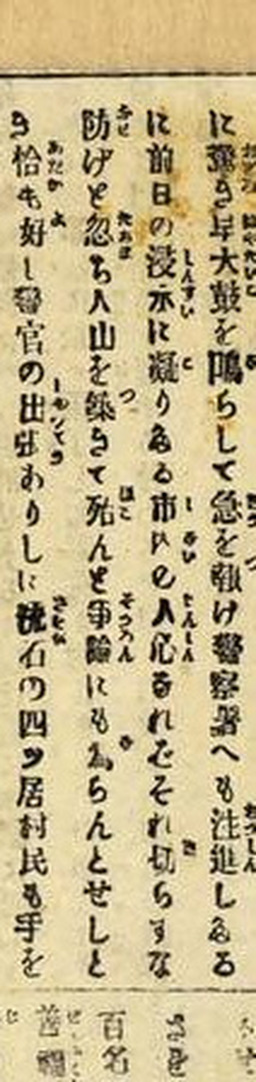防げと忽ち人山を築きて殆んど爭論にも爲らんとせしと
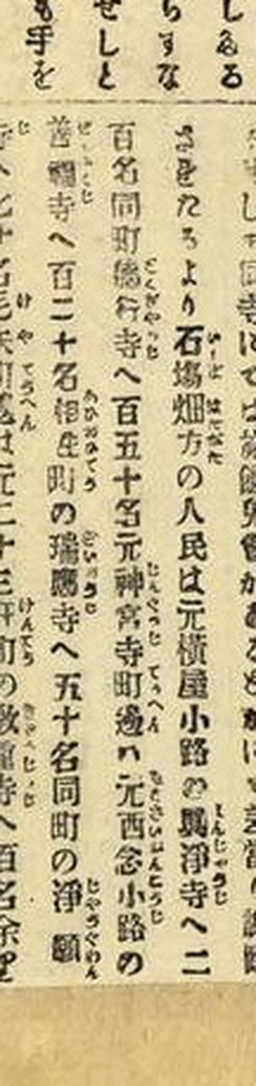百名同町德行寺へ百五十名元神宮寺町邊は元西念小路の
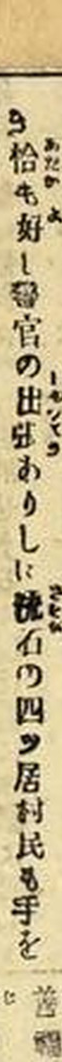き恰も好し警官の出張ありしに流石の四ッ居村民も手を
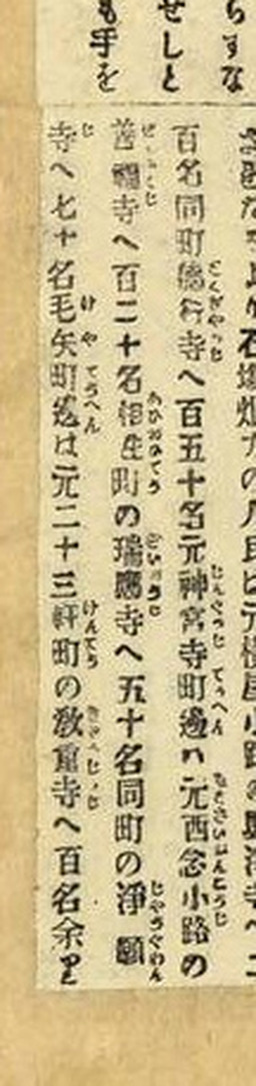善福寺へ百二十名相生町の瑞應寺へ五十名同町の淨願
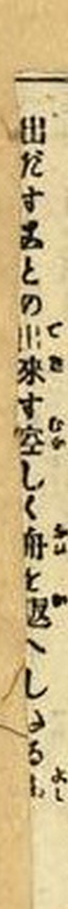出だすことの出來す空しく舟を返へしたる由
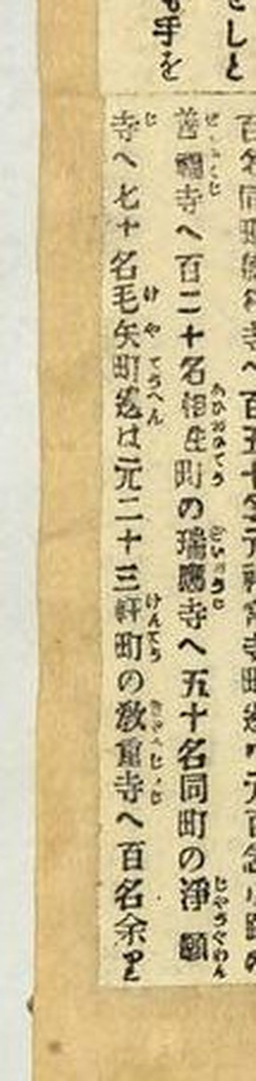寺へ七十名毛矢町邊は元二十三軒町の教重寺へ百名余り

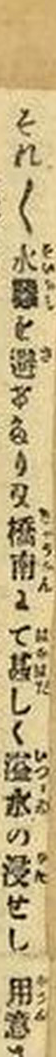それ〳〵水難を避けたり又橋南にて甚しく溢水の浸せし
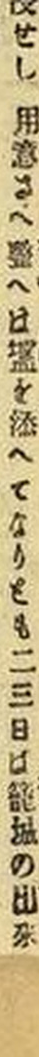用意さへ整へは塩を添へてなりとも二三日は籠城の出來
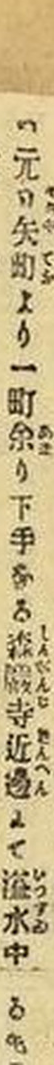は元其矢町り一町余り下手なる森巖寺近邊にて溢水中
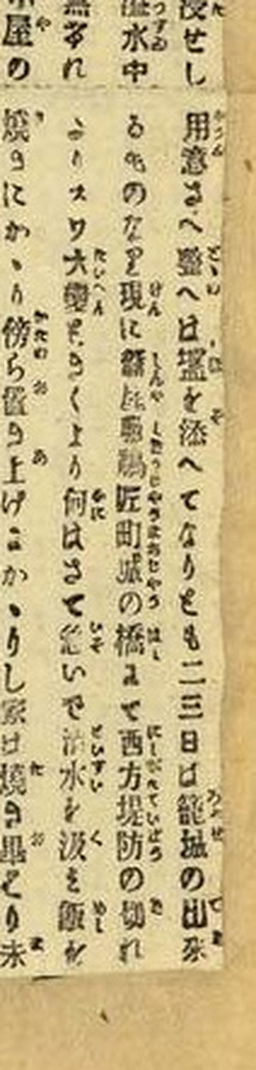るものなり現に新屋敷鵜匠町城の橋にて西方堤防の切れ
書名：温古集 五巻
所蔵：福井県文書館 Fukui Prefectural Archives
